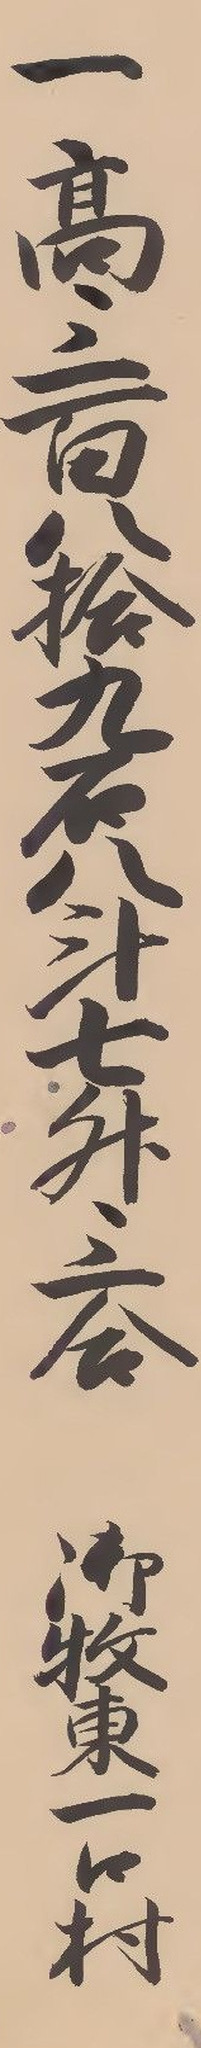一高三百八拾九石八斗七升三合御牧東一口村

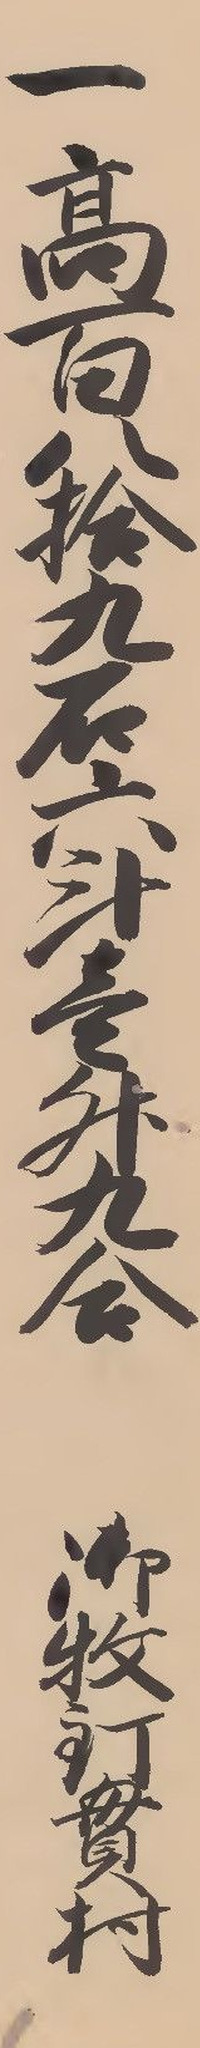一高百八拾九石六斗壱升九合御牧釘貫村
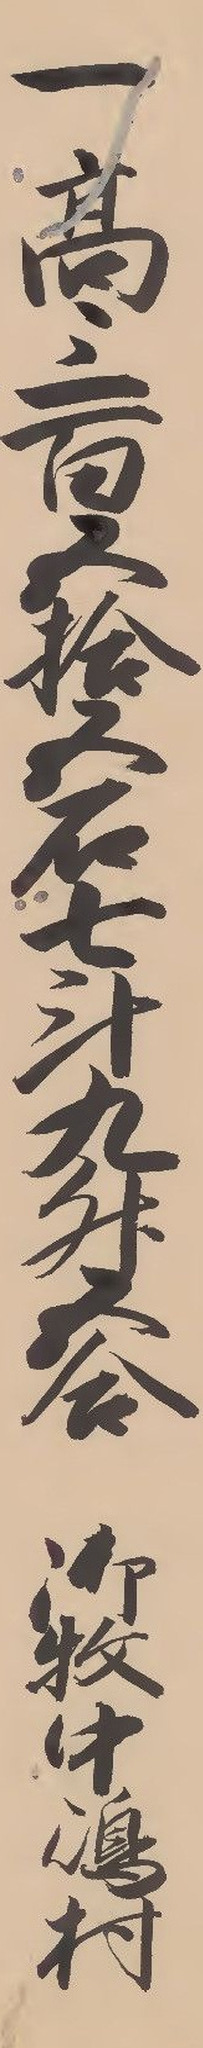一高三百五拾五石七斗九升五合御牧中嶋村
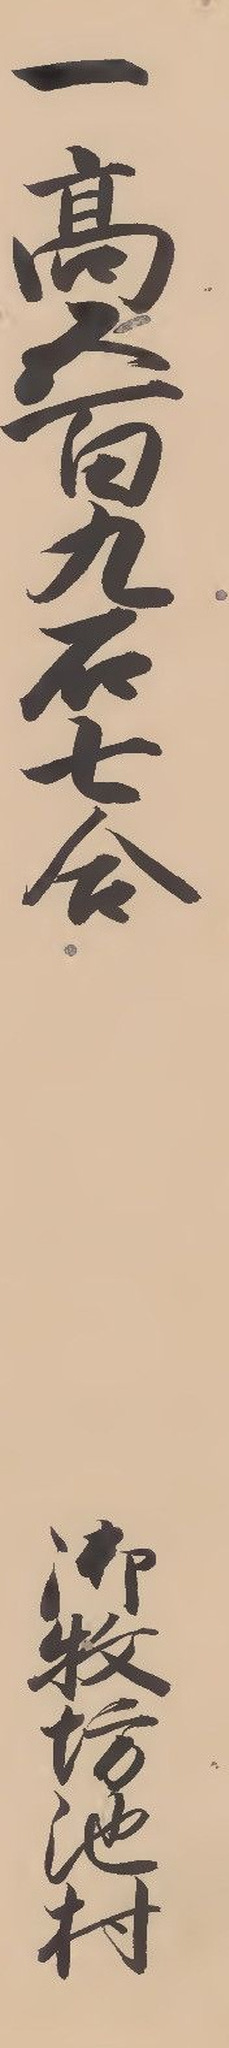一高五百九石七合御牧坊池村
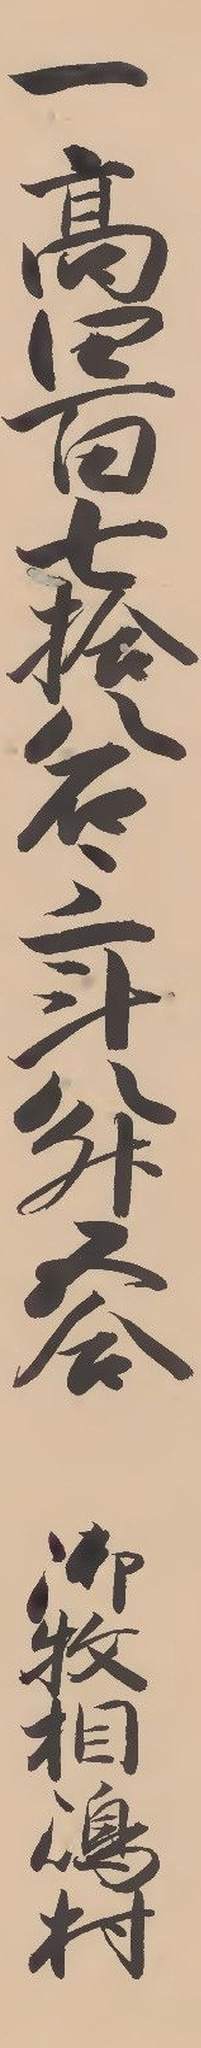一高四百七拾八石三斗八升五合御牧相嶋村
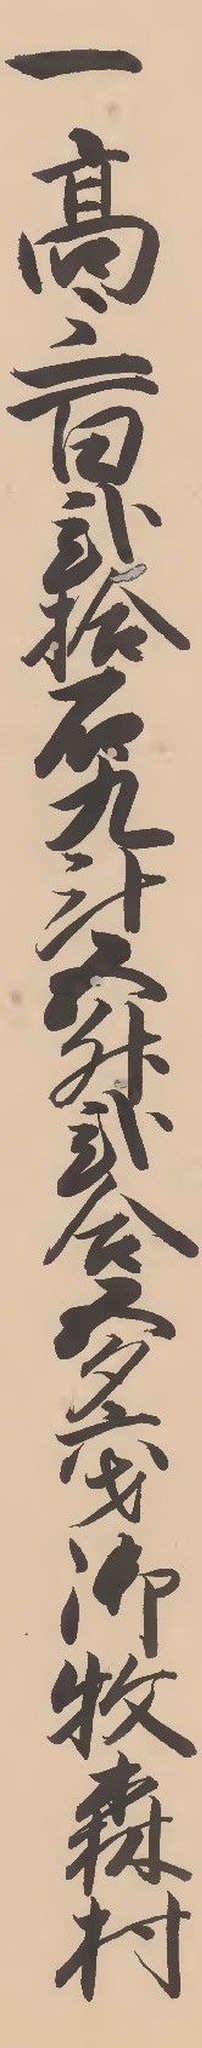一高三百弐拾石九斗五升弐合五勺六才御牧森村
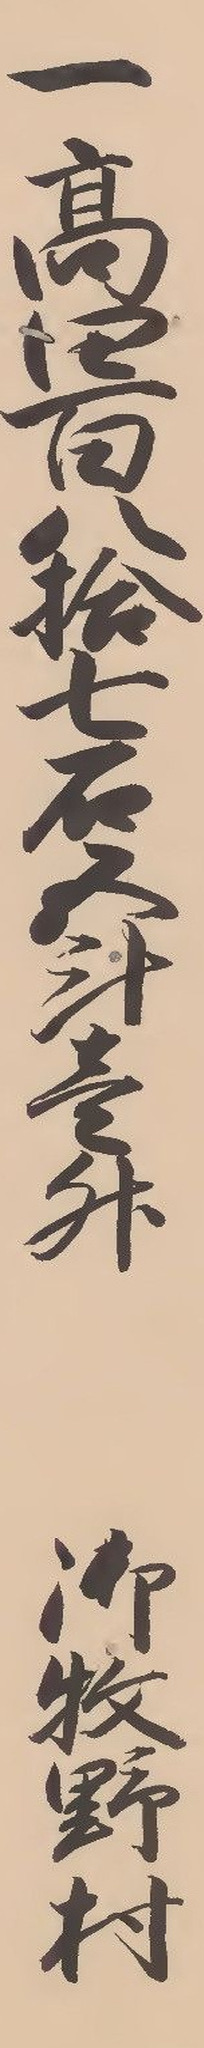一高四百八拾七石五斗壱升御牧野村
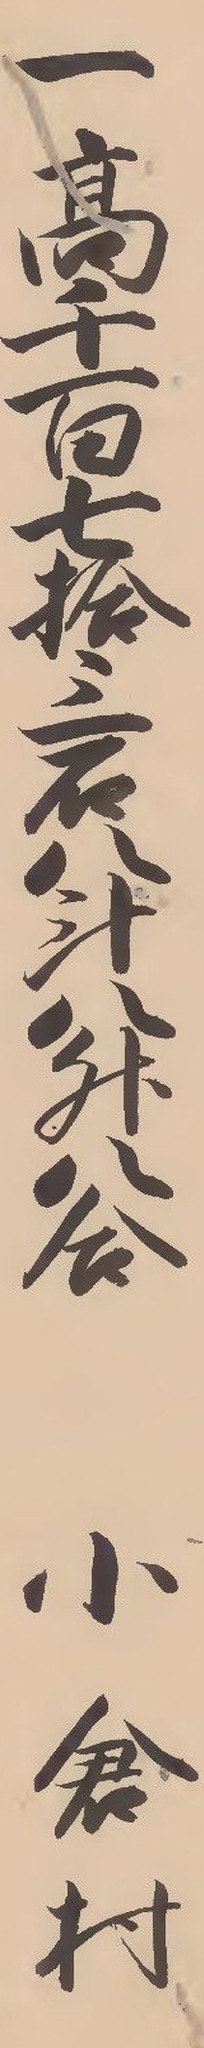一高千百七拾三石八斗八升八合小倉村
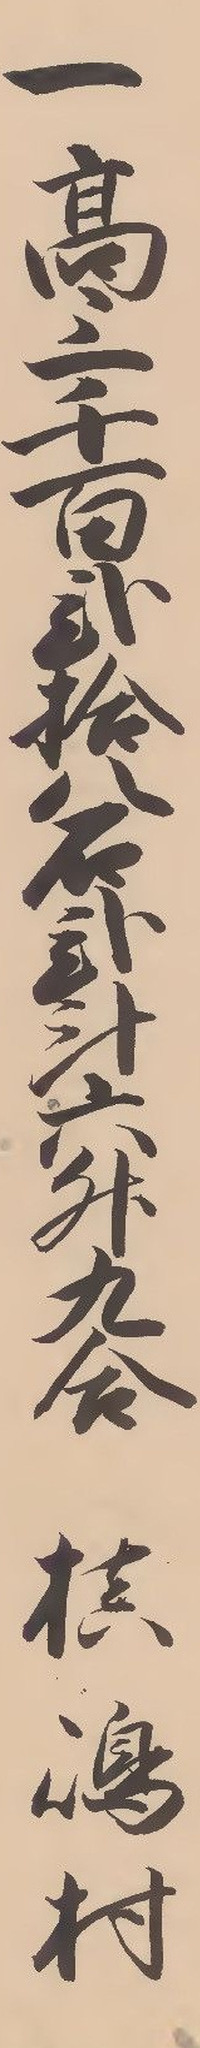一高三千百弐拾八石弐斗六升九合槙島村

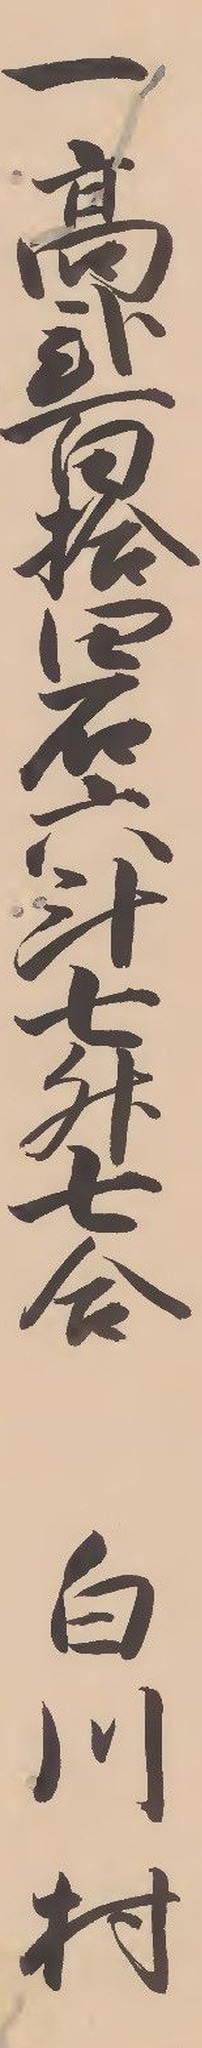一高弐百拾四石六斗七升七合白川村
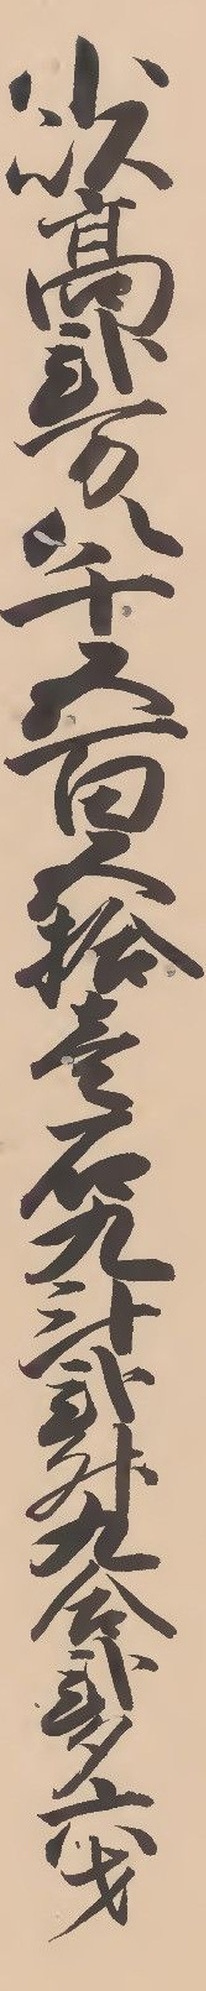小以高弐万八千五百五拾壱石九斗弐升九合弐勺六才

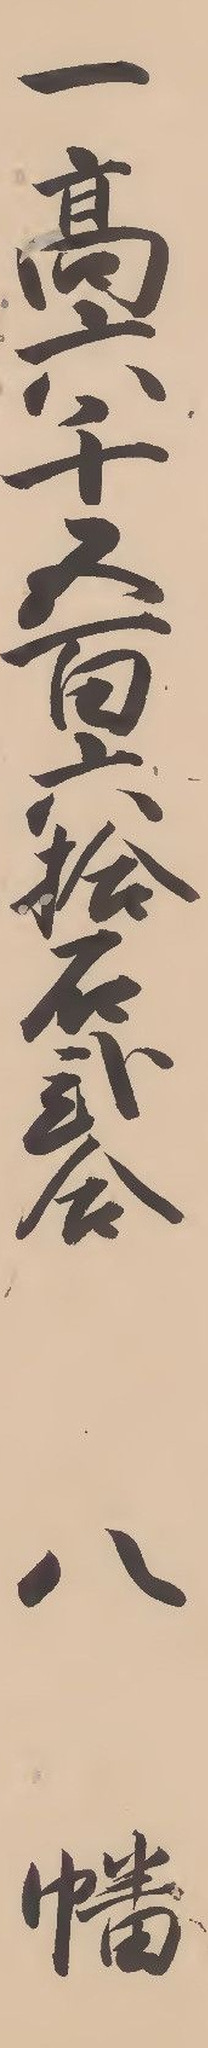一高六千五百六拾石弐合八幡
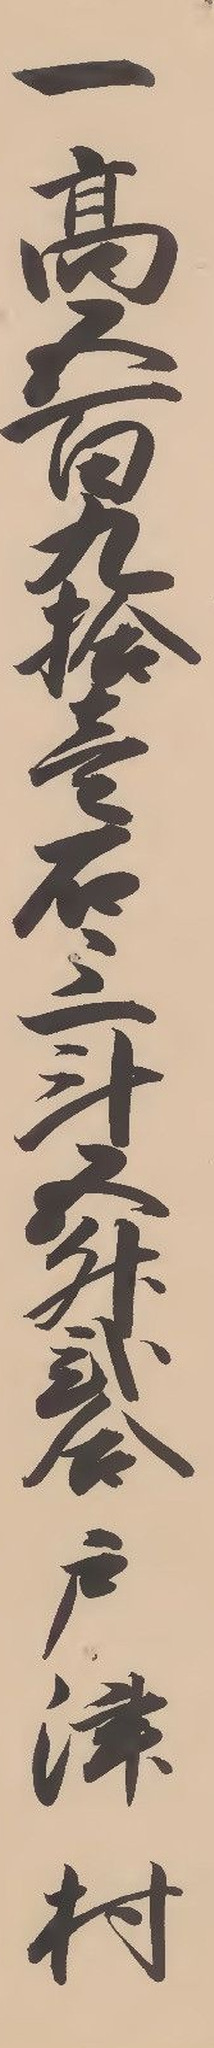一高五百九拾壱石三斗五升弐合戸津村
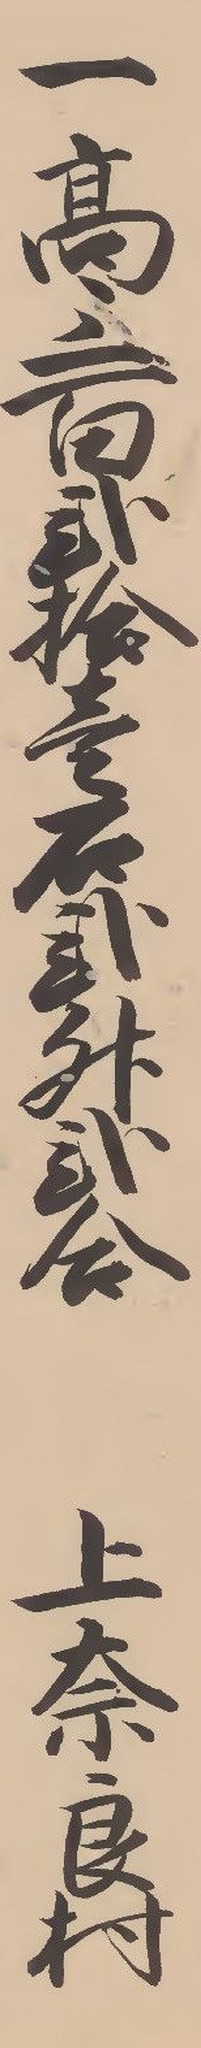一高三百弐拾壱石弐升弐合上奈良村
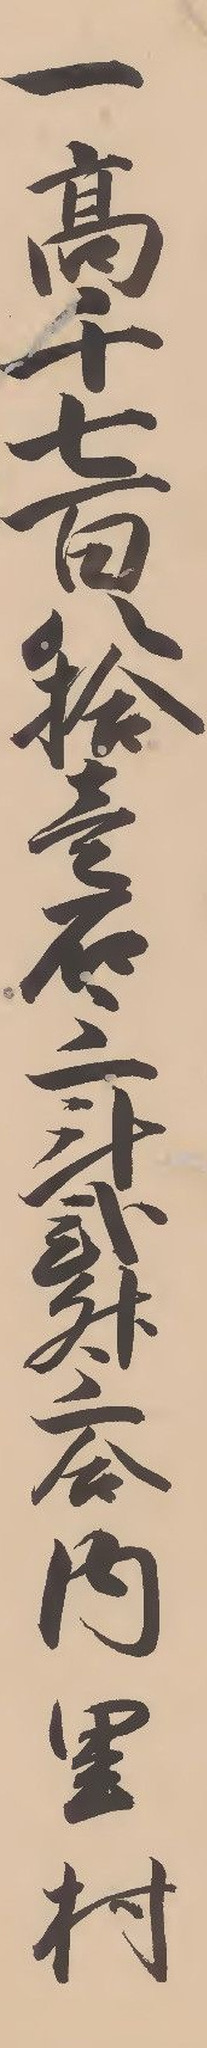一高千七百八拾壱石三斗弐升三合内里村
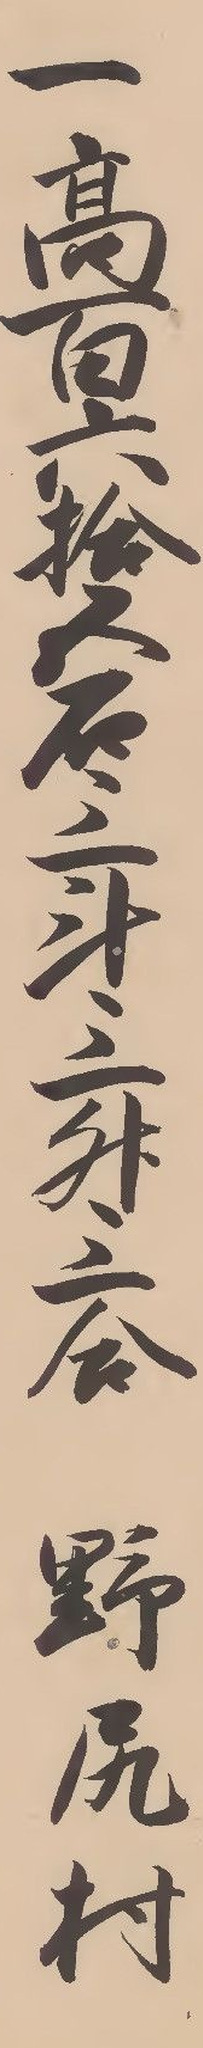一高百六拾五石三斗三升三合野尻村
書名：山城国郷帳
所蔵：国立公文書館 National Archives of Japan
